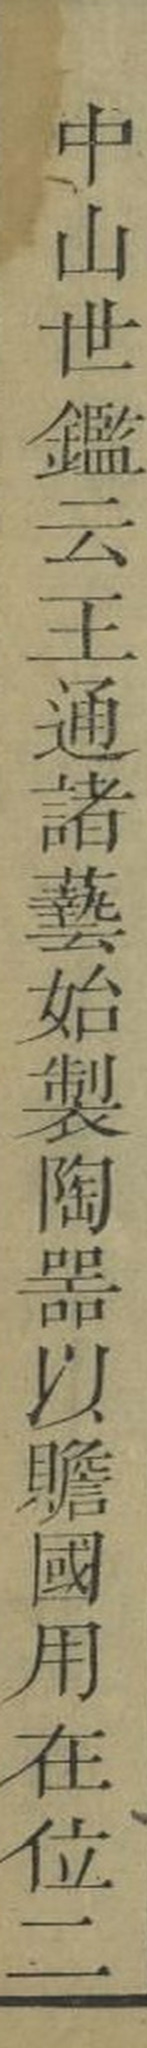中山世鑑云王通諸芸始製陶器以贍国用在位二

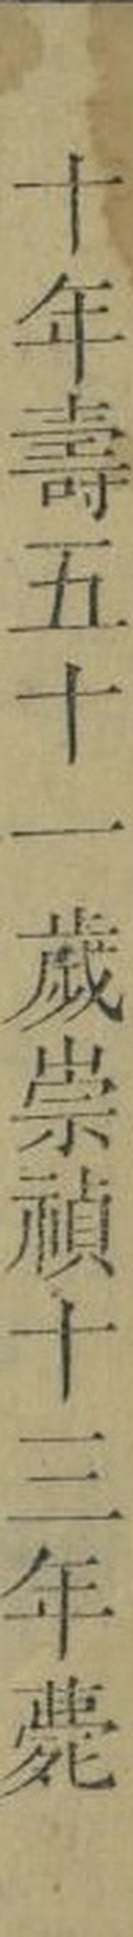十年寿五十一歳崇禎十三年薨
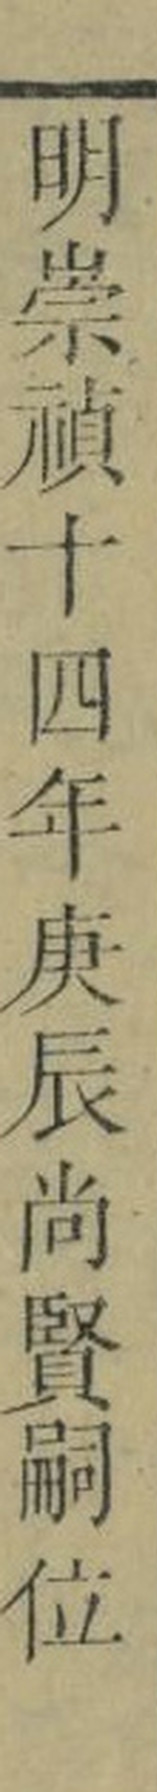明崇禎十四年庚辰尚賢嗣位
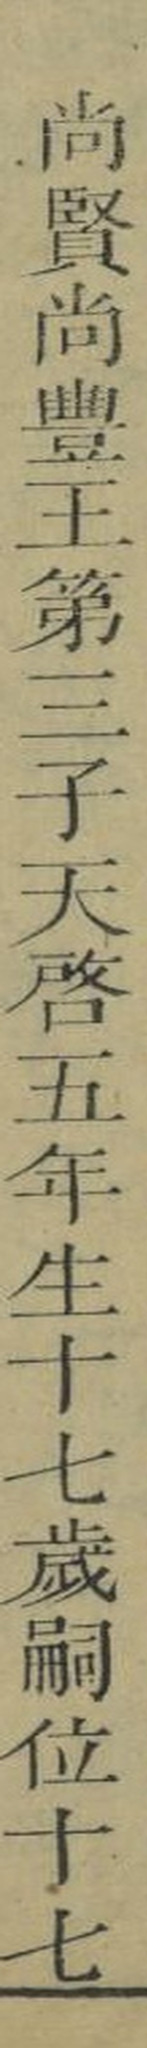尚賢尚豊王第三子天啓五年生十七歳嗣位十七
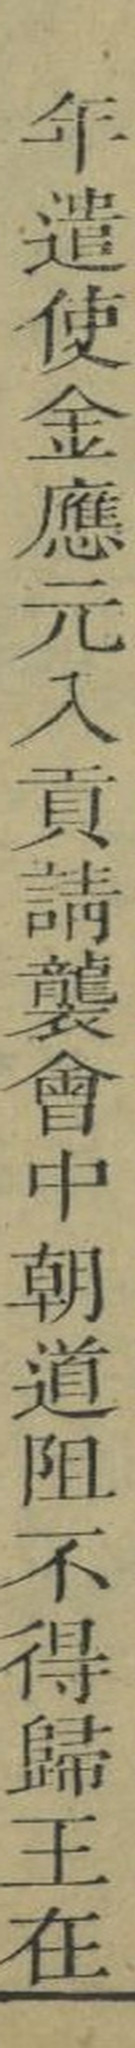年遣使金応元入貢請襲会中朝道阻不得帰王在
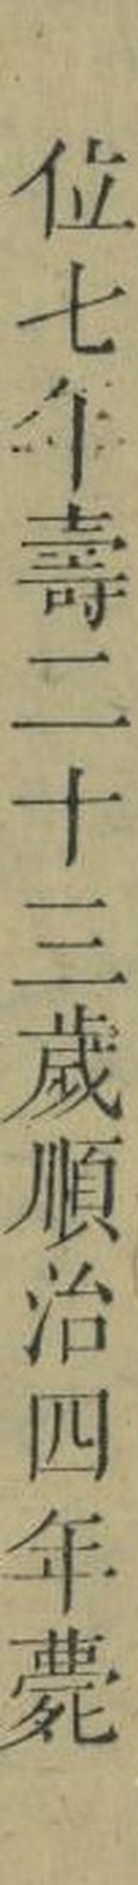位七年寿二十三歳順治四年薨
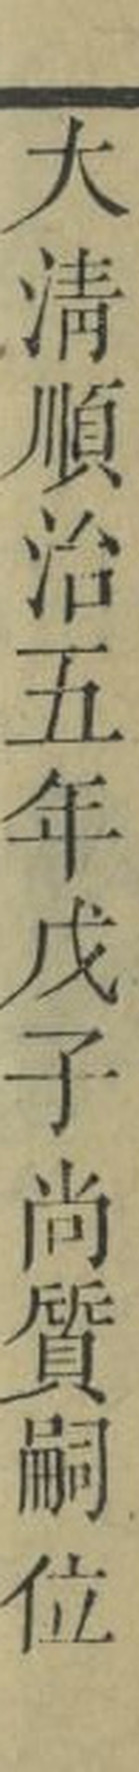大清順治五年戌子尚質嗣位
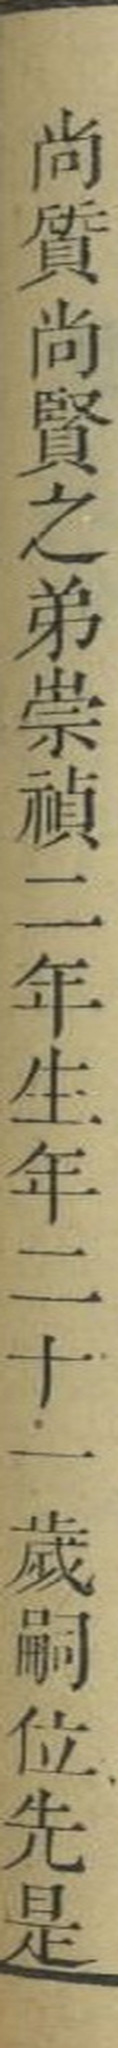尚質尚賢之弟崇禎二年生年二十一歳嗣位先是
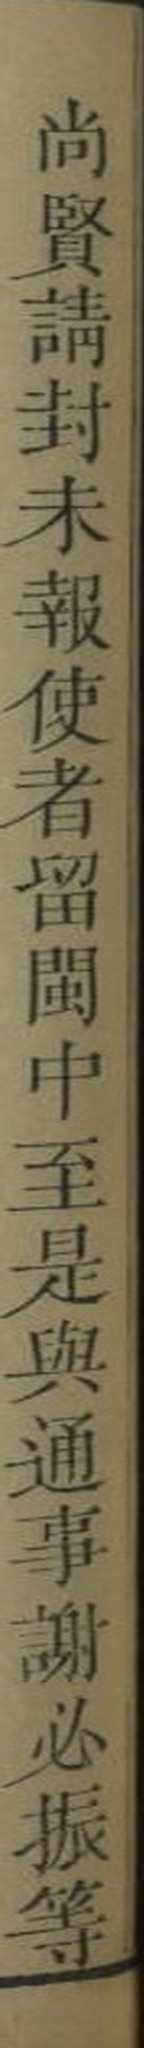尚賢請封未報使者留閩中至是与通事謝必振等
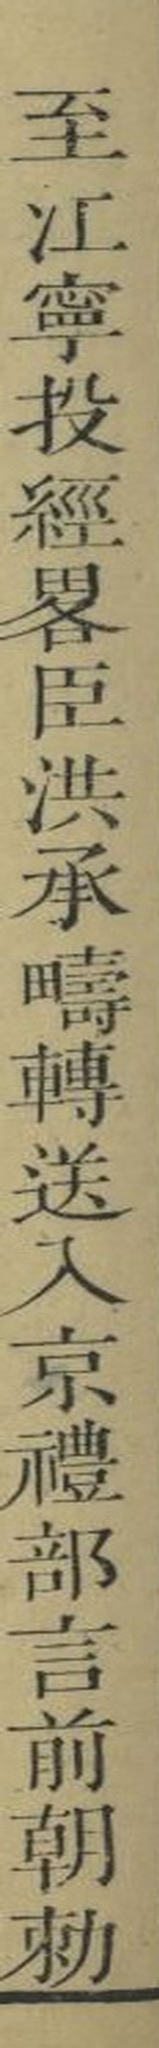至江寧投経略臣洪承疇転送入京礼部言前朝勅
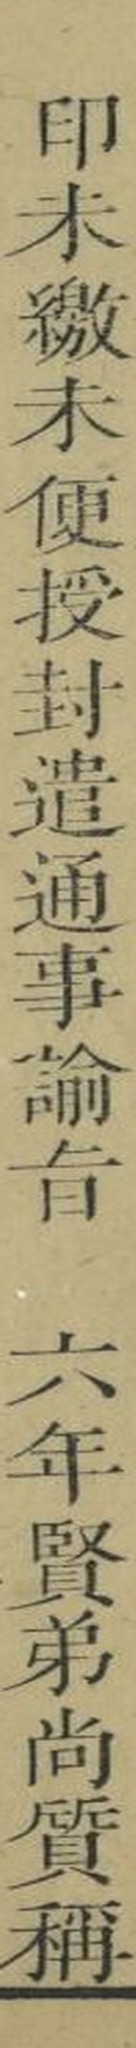印未繳未便授封遣通事諭旨六年賢弟尚質称
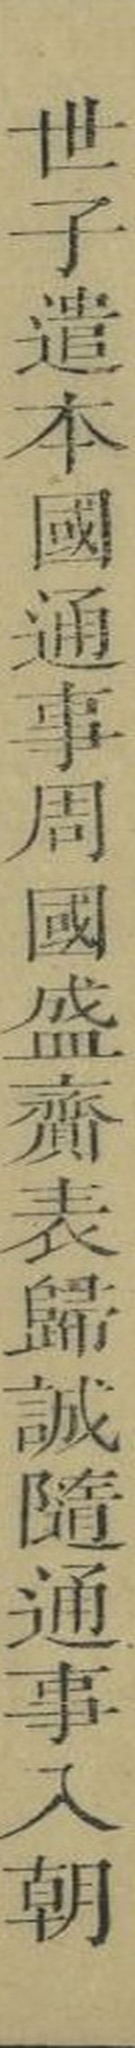世子遣本国通事周国盛齎表帰誠随通事入朝
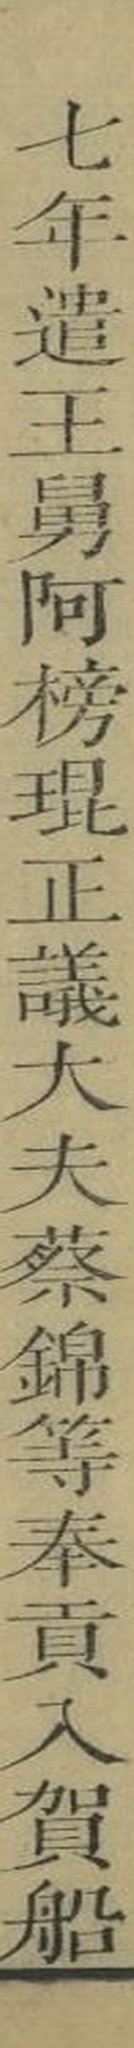七年遣王舅阿榜琨正議大夫蔡錦等奉貢入賀船
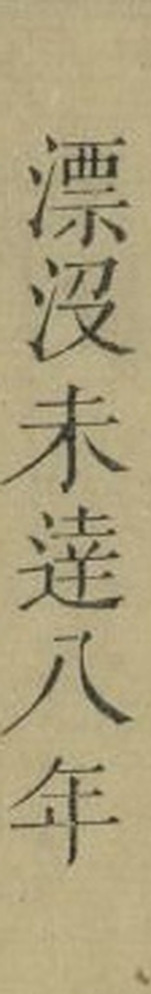漂没未達八年
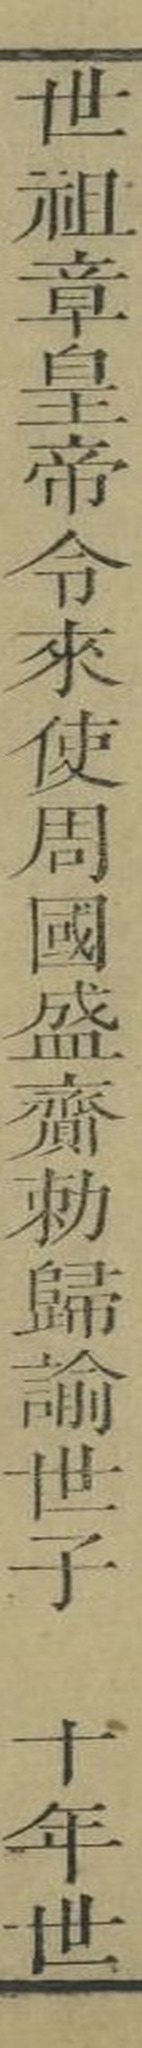世祖章皇帝令来使周国盛齎勅帰諭世子十年世
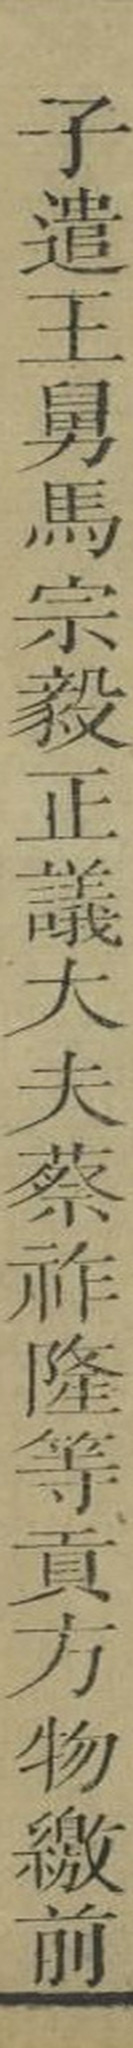子遣王舅馬宗毅正議大夫蔡祚隆等貢方物繳前
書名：中山伝信録 巻三
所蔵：University of the Ryukyus Library
